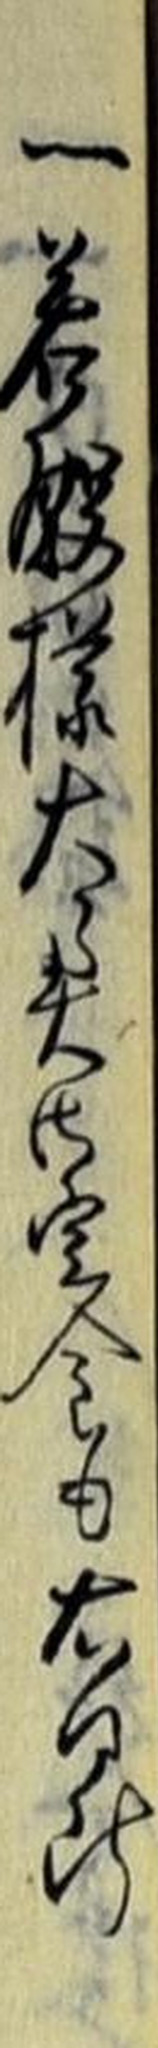一若殿様大奥御定金も右同断
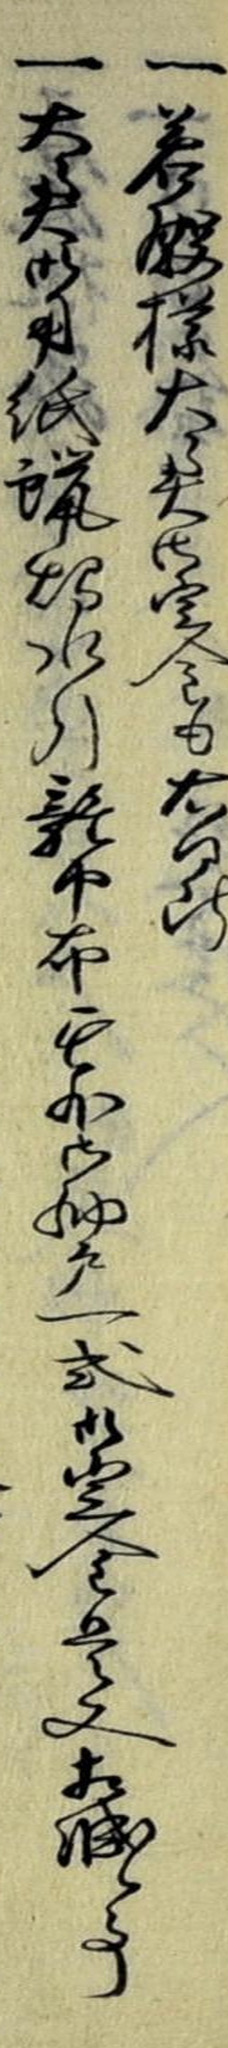一大奥御用紙蝋燭水引雑巾布其外御納戸一式御定金是又相減候事
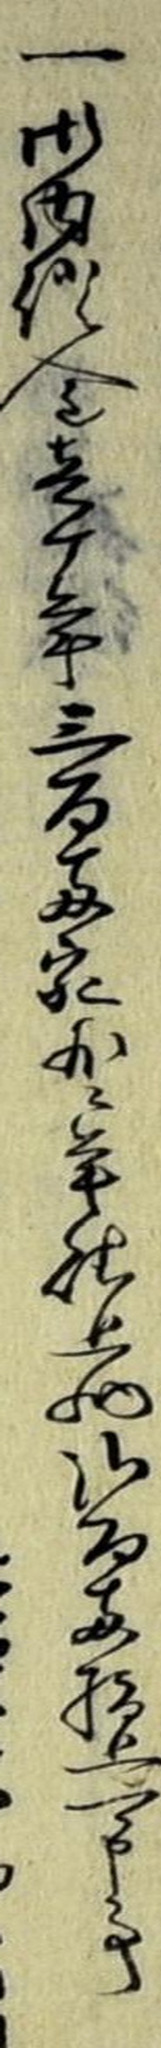一御内証金壱ケ年三百両宛外に年賦上納弐百両指上可申事
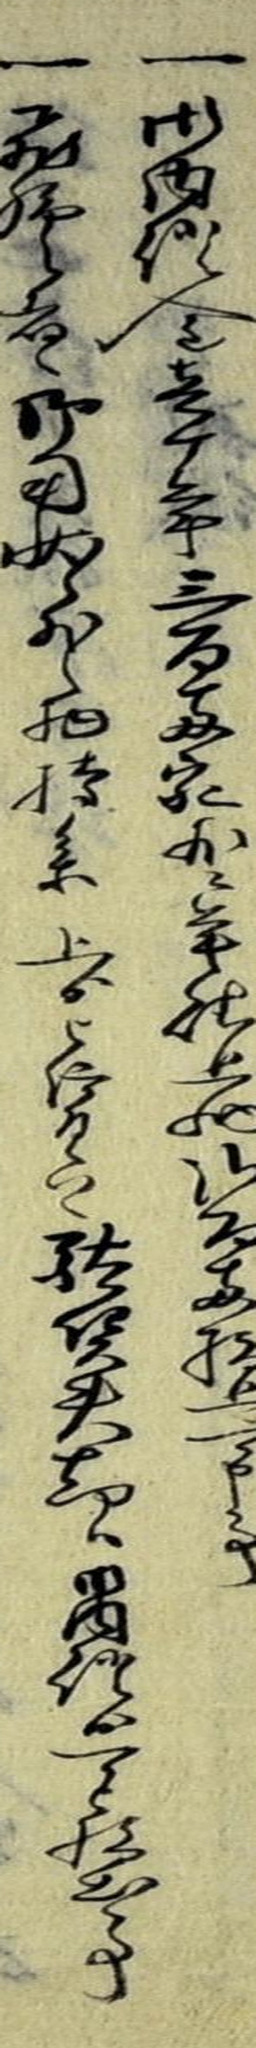一飛脚之者へ御用状之外之物持参上ゟ被仰付候はゝ駄賃失却は御内証ゟ可被指出事
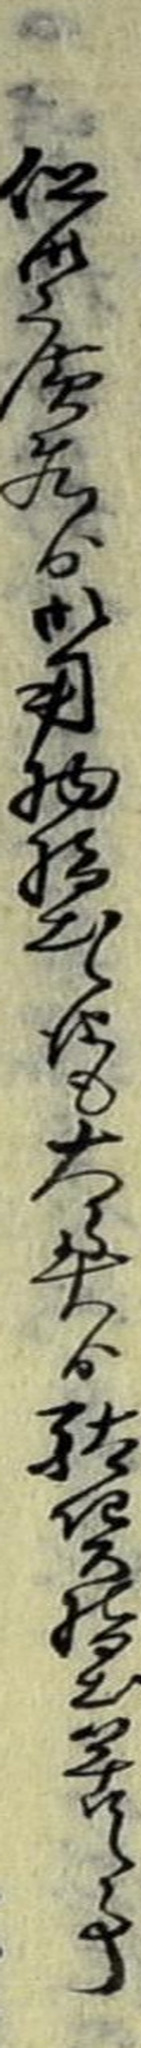但御広敷ゟ御用物指出候儀も大奥ゟ駄賃指出筈之事
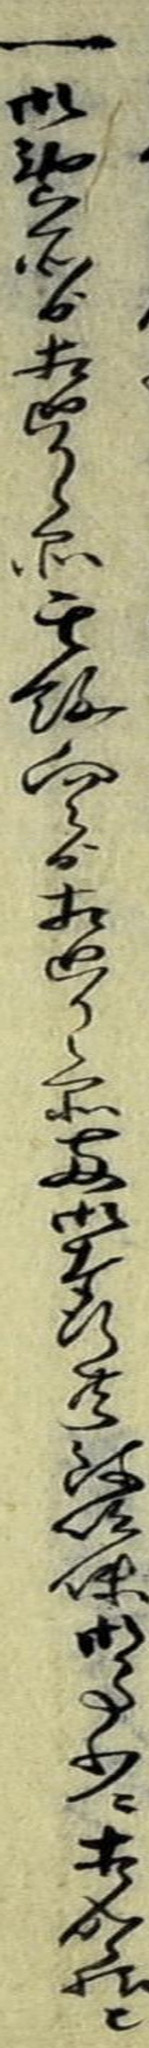一御台所ゟ相廻り之品其余向々ゟ相廻り之品両御奉行共致吟味御事少に相成候様被
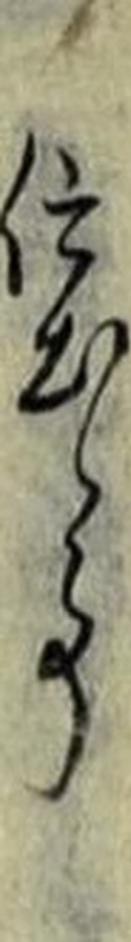仰出候事
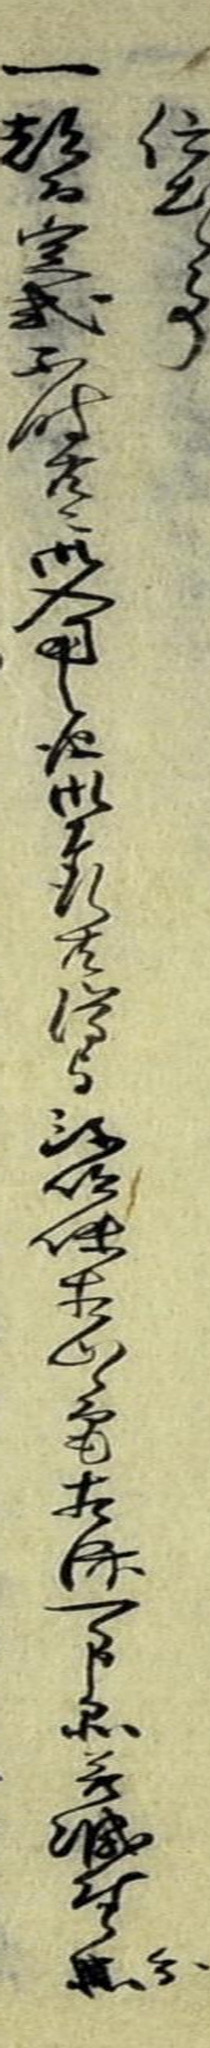一都而定式不時共に御入用之儀御奉行共得与致吟味相止候而も相済可申品并減付候様分
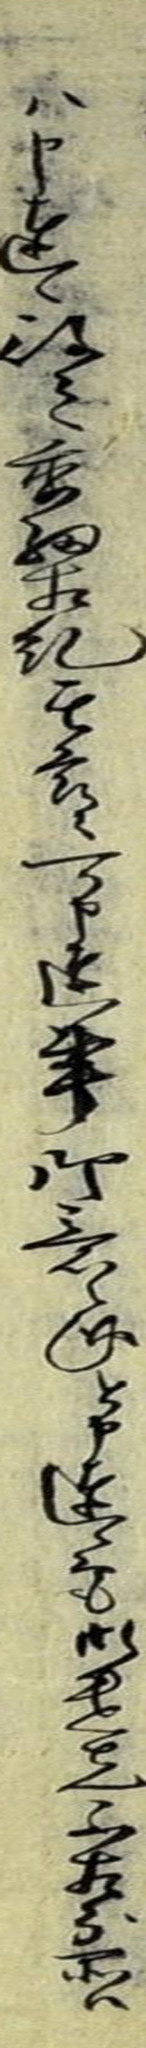は申達候役々へ委細相糺其節々可申達事御意之趣と申達候而も御遣先不相分品は
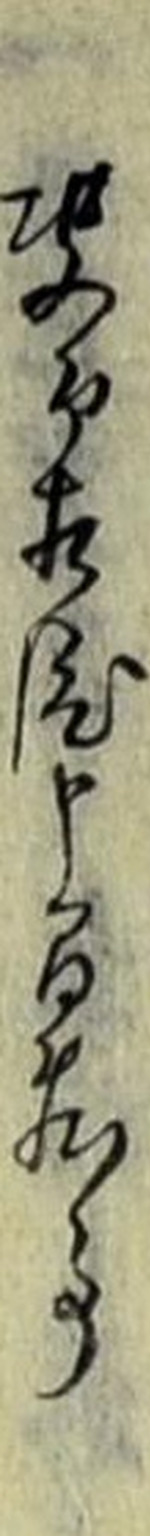決而相渡申間敷事
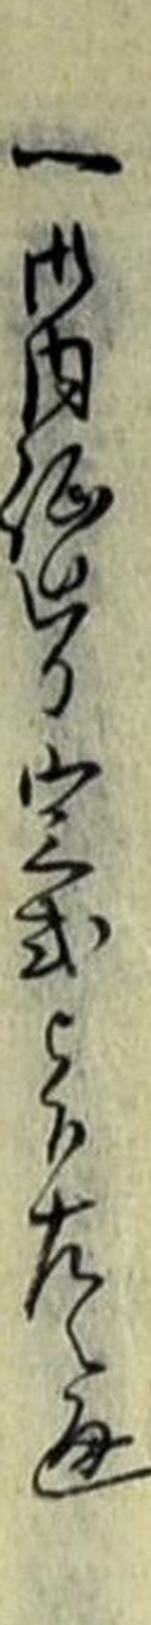一御内証廻り定式被下左之通
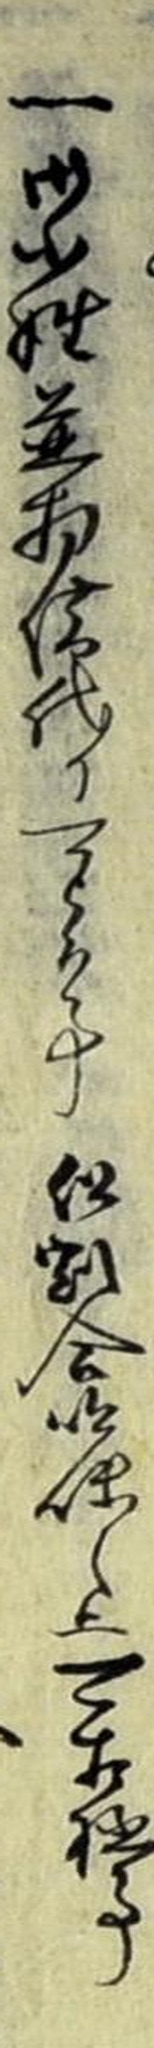一御小姓並拝借代り可被下事但割合吟味之上可相極事
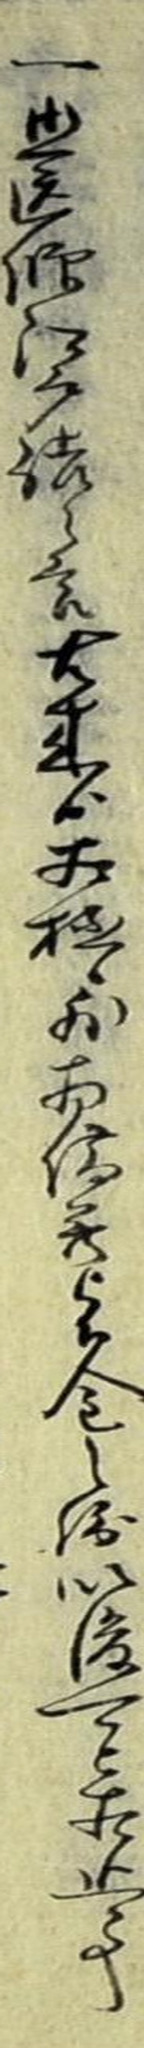一御医師江戸詰之節古来ゟ相極候外拝借并被下金之儀以後可被相止事
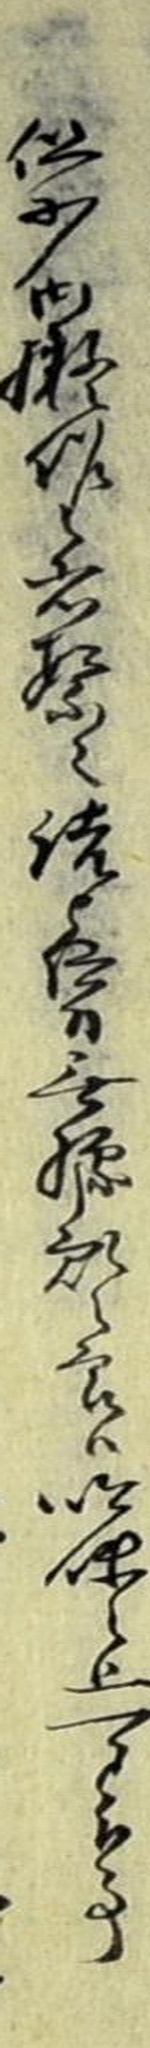但少御擬作之者繁々詰被仰付無拠願之節は吟味之上可被下事
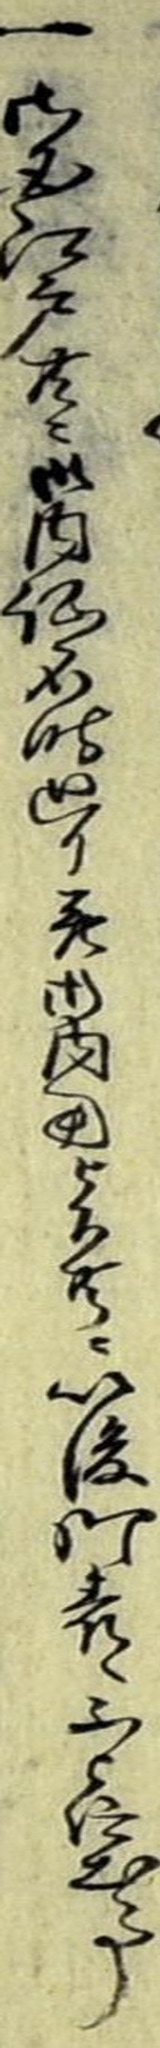一御国江戸共に御内証不時廻り并御内用被下共に以後御表へ不被仰出事
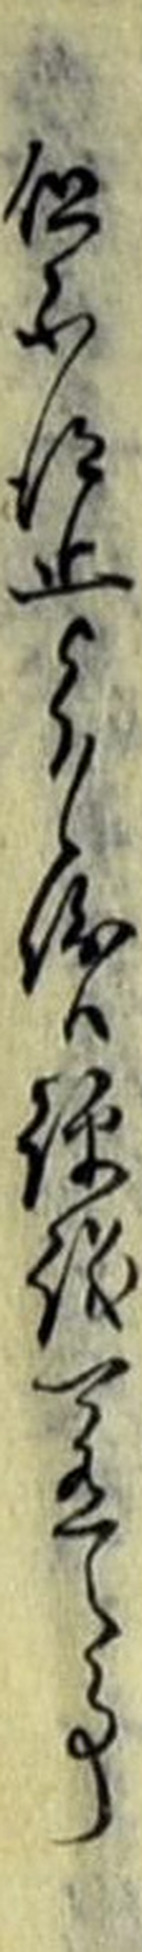但不得止被下儀は評議可有之事
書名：命令之部 二
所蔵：福井県文書館 Fukui Prefectural Archives
